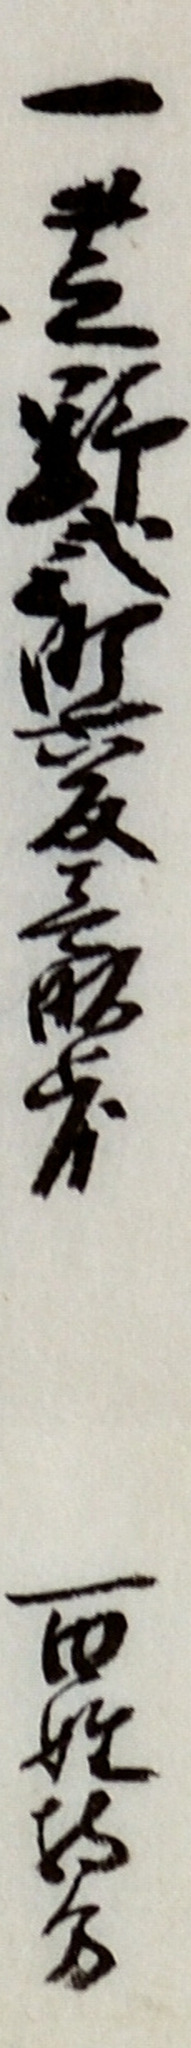一芝野弐町六反壱畝歩百姓持分
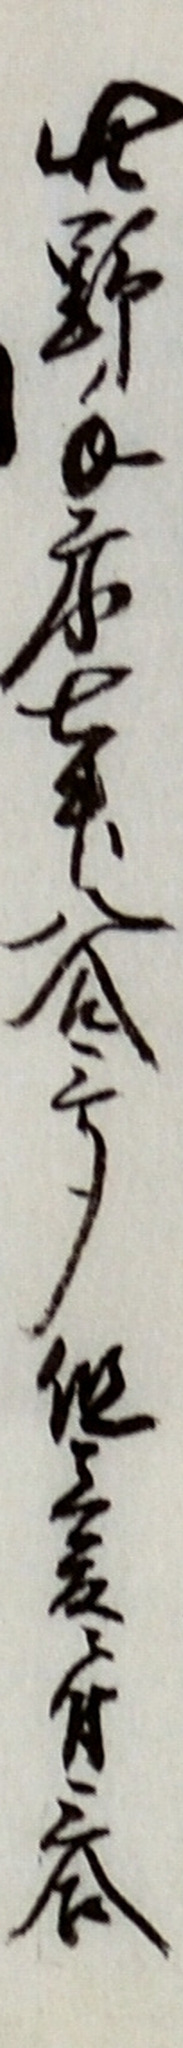此野手米七升八合三勺但壱反ニ付三合
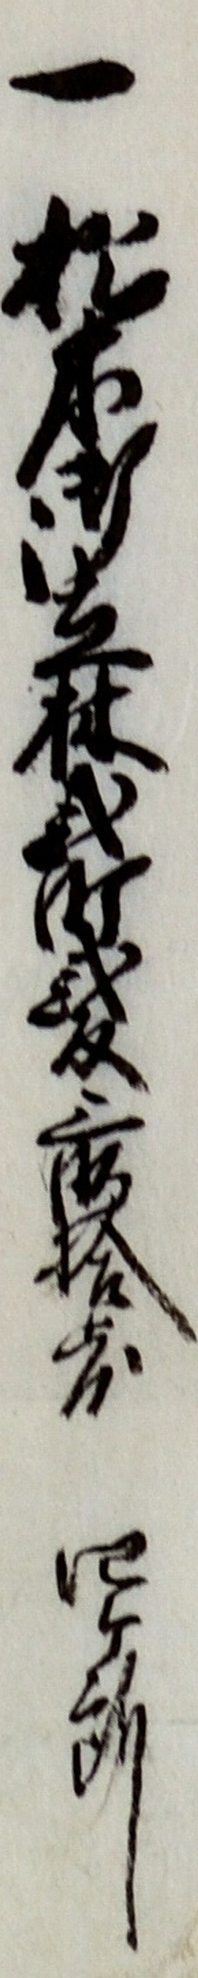一松木御立林弐町弐反三畝拾歩四ケ所

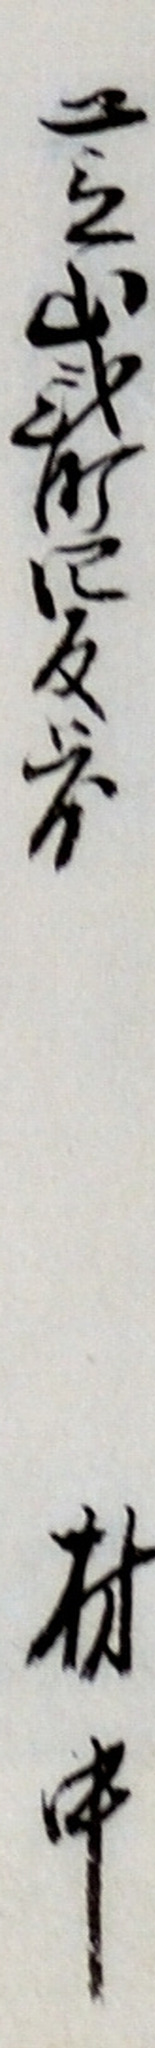芝山弐町四反歩村中
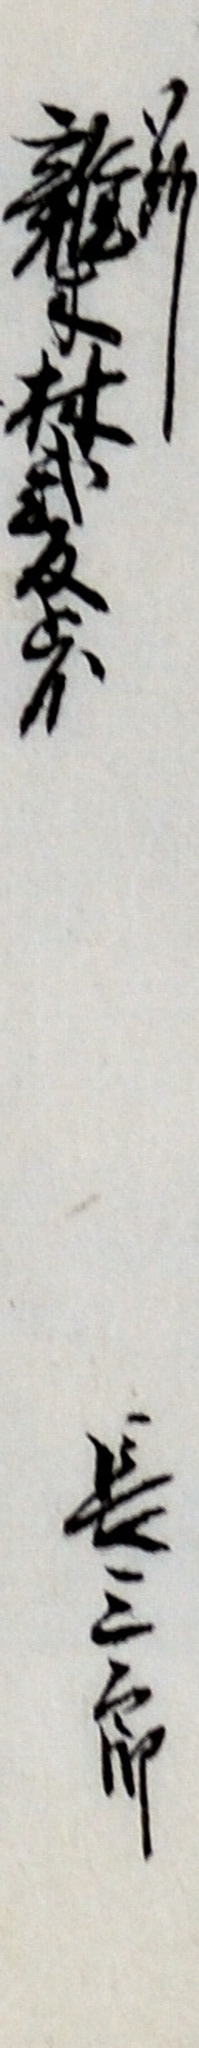雑木林弐反歩長三郎
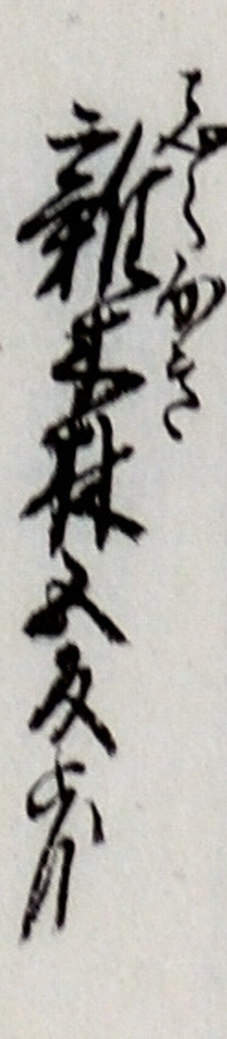雑木林五反歩惣助
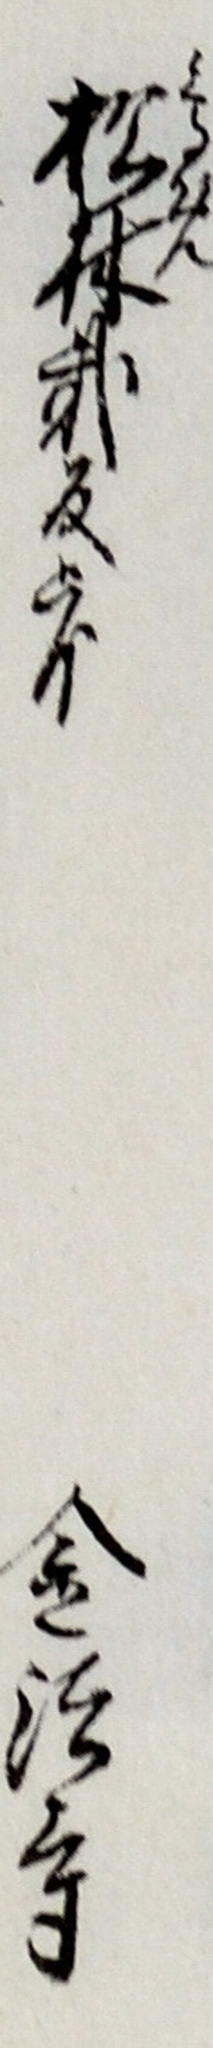松林弐反歩金法寺
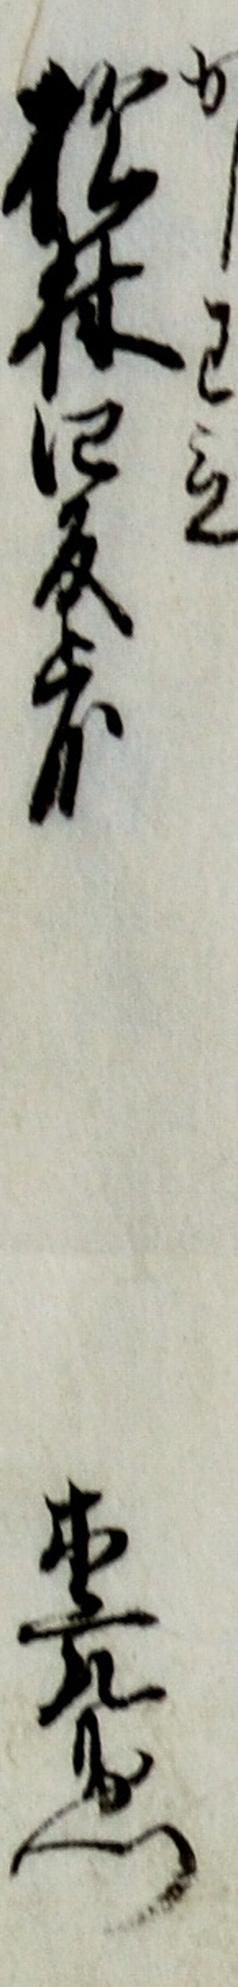松林四反歩杢左衛門

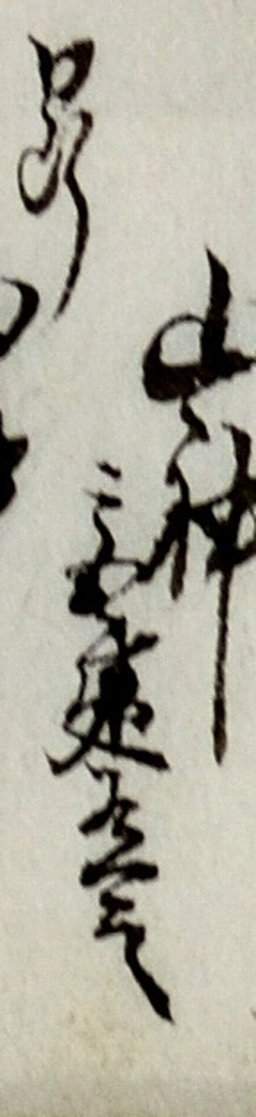宮建有之
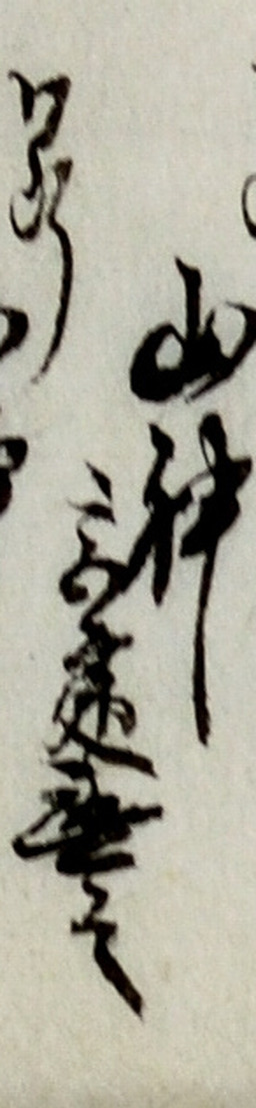宮建無之
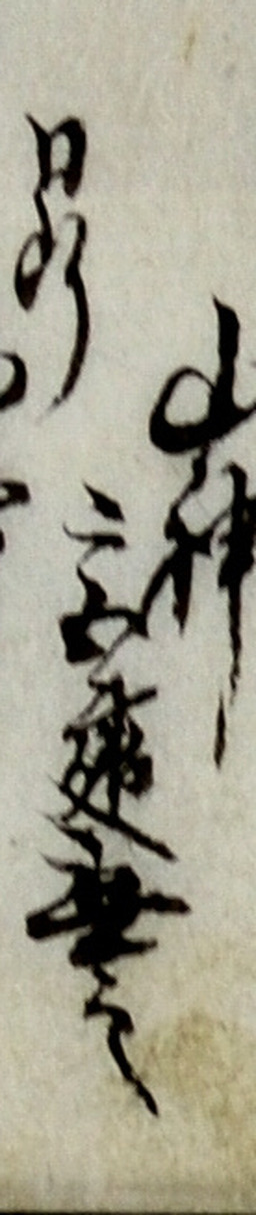宮建無之

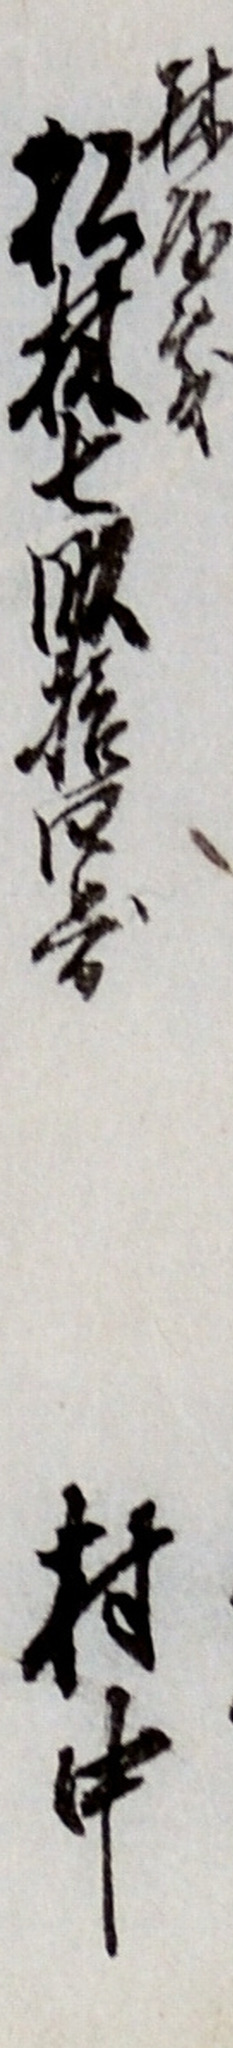松林七畝拾四歩村中

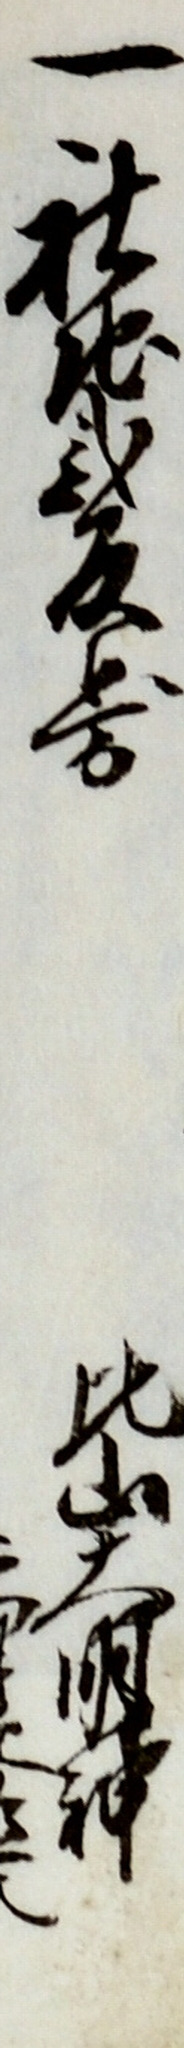一社地弐反歩比山大明神
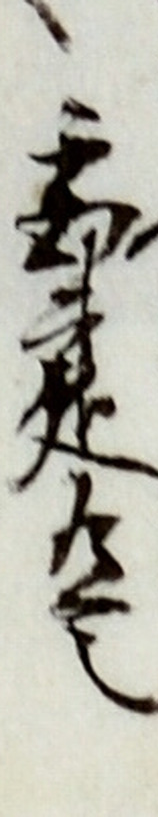宮建有之
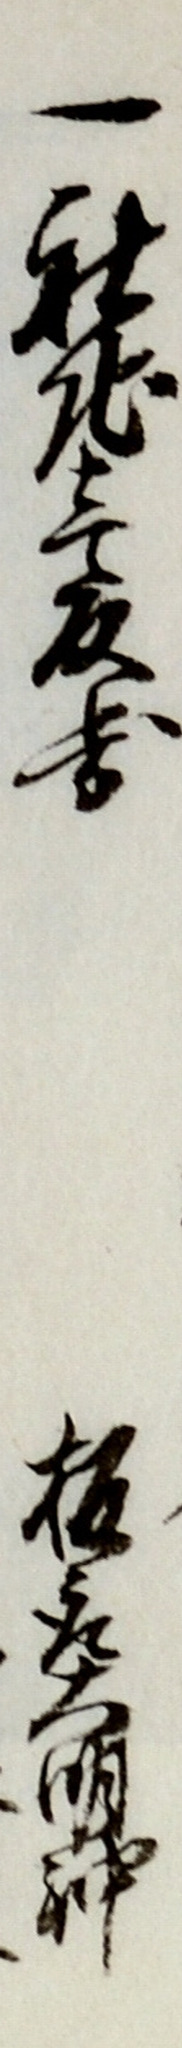一社地壱反歩板取大明神
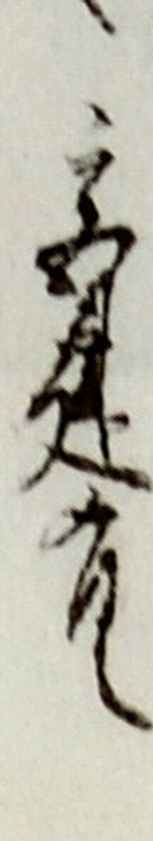宮建有之
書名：御領分中山林社地手控
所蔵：伊那市立高遠町図書館・合同会社AMANE
